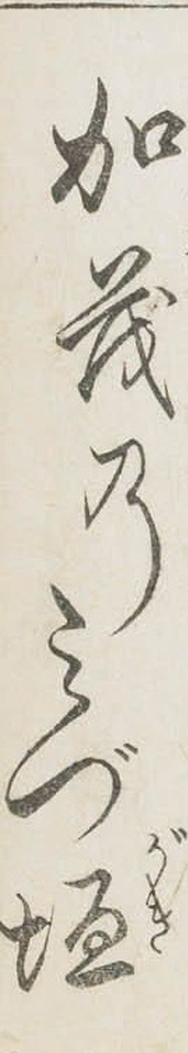加茂のみづ垣
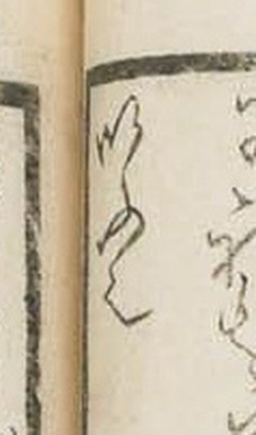いふ也
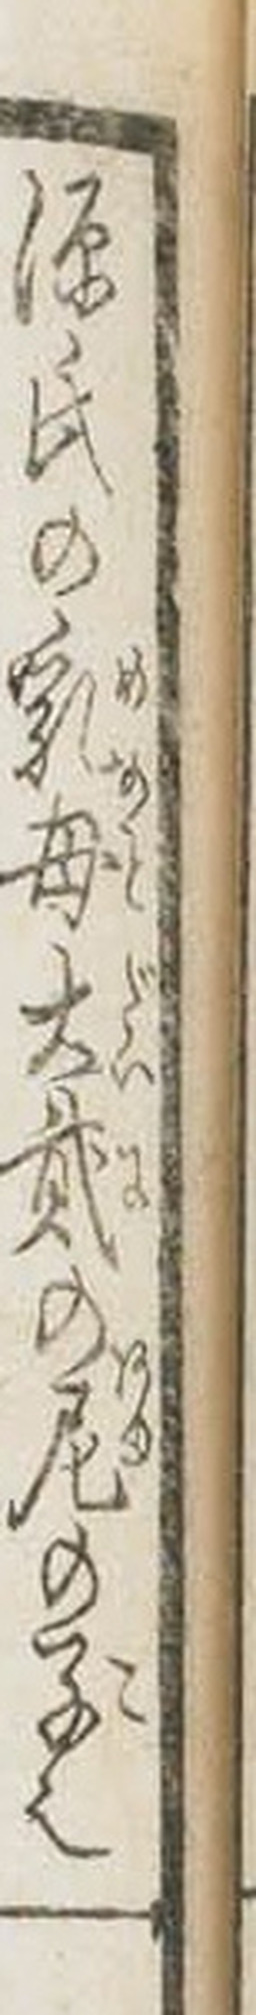源氏の乳母大弐の尼の子也
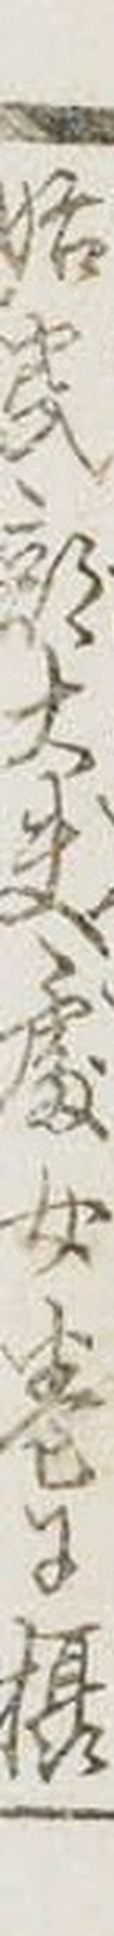始民部大夫処女巻に摂
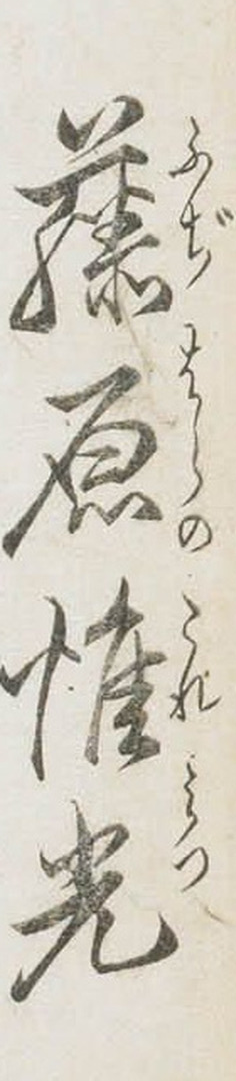藤原惟光
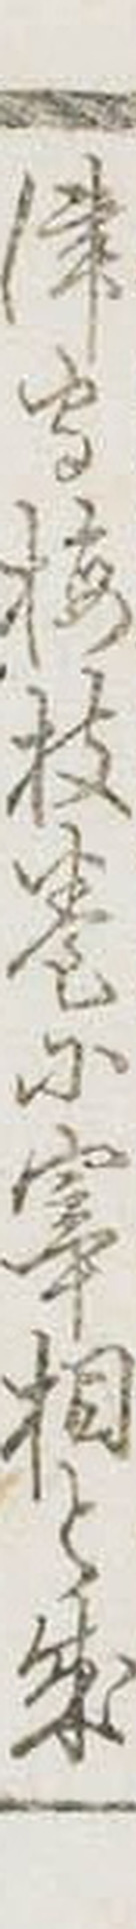津守梅枝巻に宰相と成
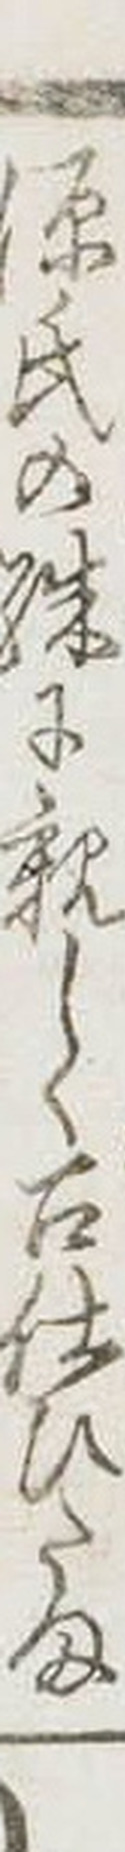源氏の殊に親しく召仕ひたま
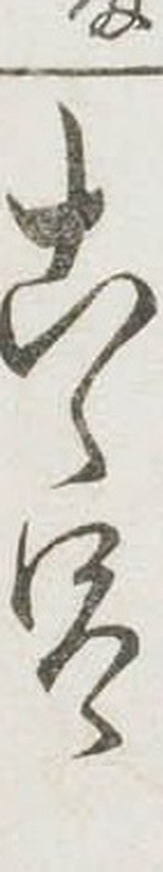こゝろ
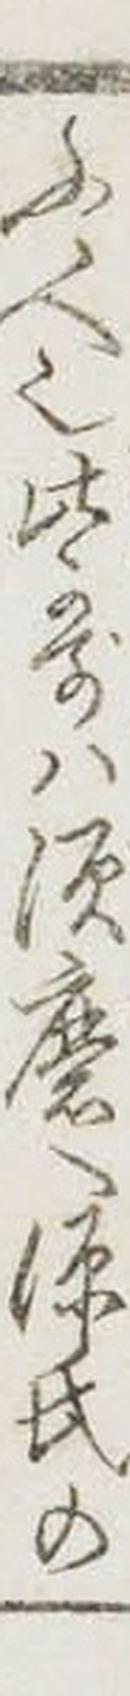ふ人也此哥は須磨へ源氏の
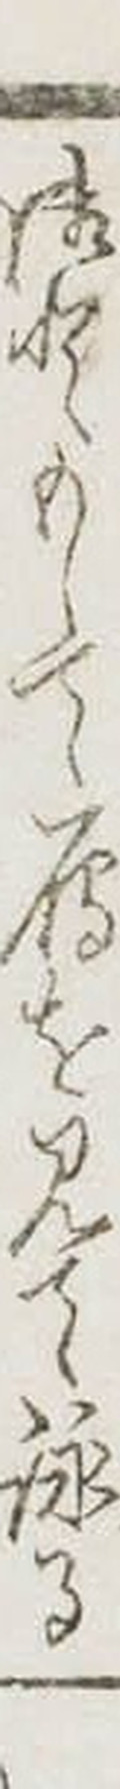御ともして鴈を見て詠る
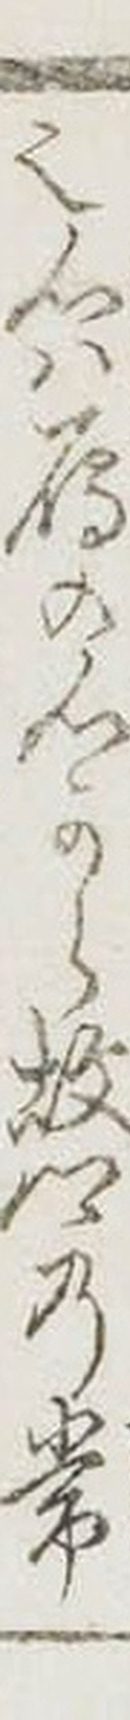也心は鴈の心から故郷の常
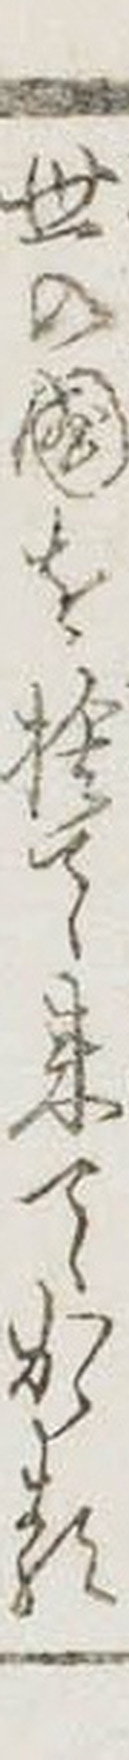世の国を捨て来てかゝる
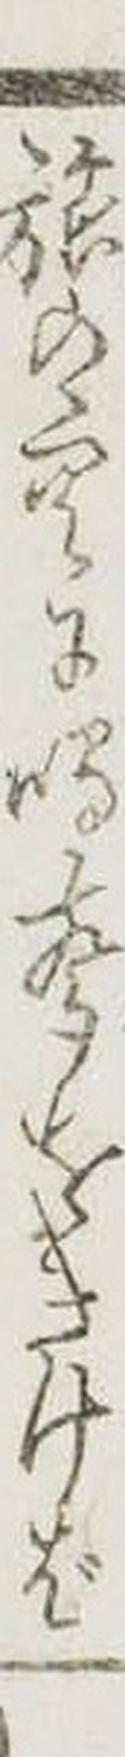旅の空に鳴声をきけば
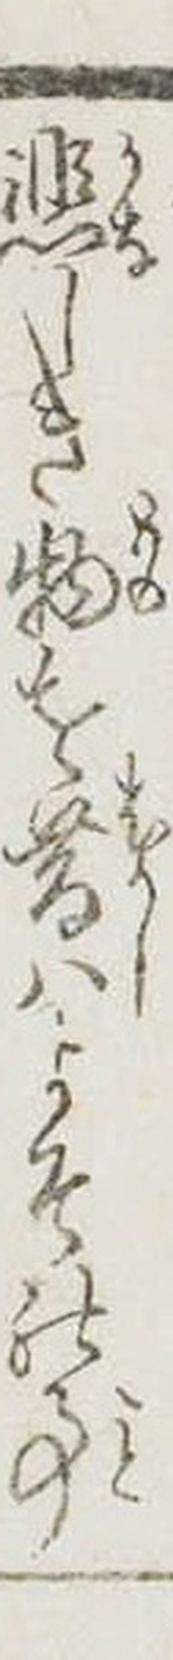悲しき物を昔はよその事
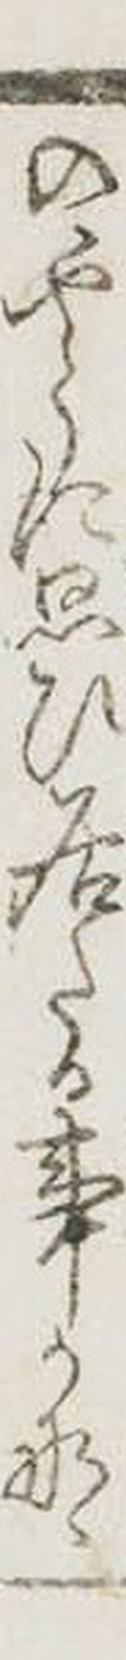のやうに思ひ居たる事かな
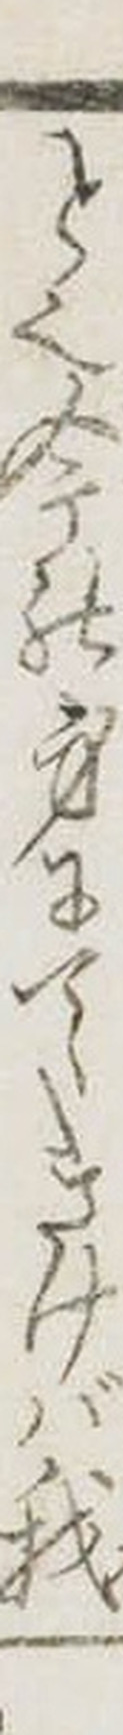と也今の身にてきけば我
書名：源氏百人一首
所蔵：東京学芸大学教育コンテンツアーカイブ
